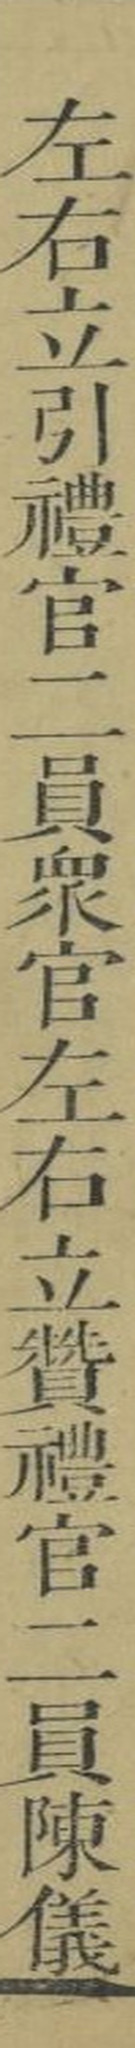左右立引禮官二員衆官左右立贊禮官二員陳儀
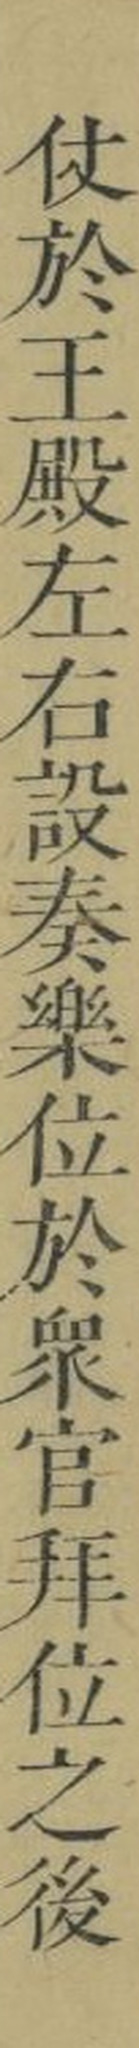仗於王殿左右設奏樂位於衆官拜位之後
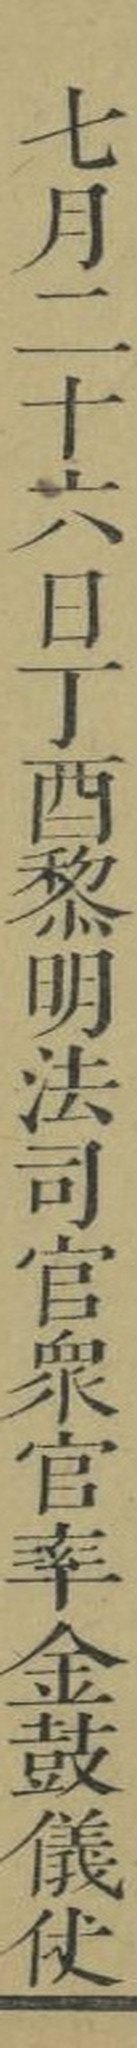七月二十六日丁酉黎明法司官衆官率金鼓儀仗
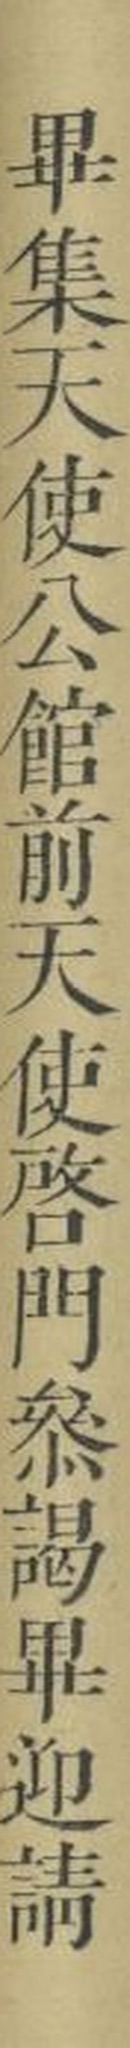畢集天使公館前天使啓門叅謁畢迎請
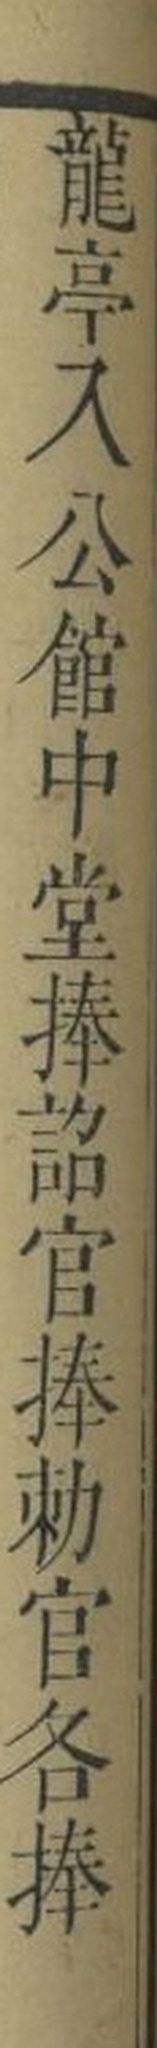龍亭入公館中堂捧詔官捧勅官各捧
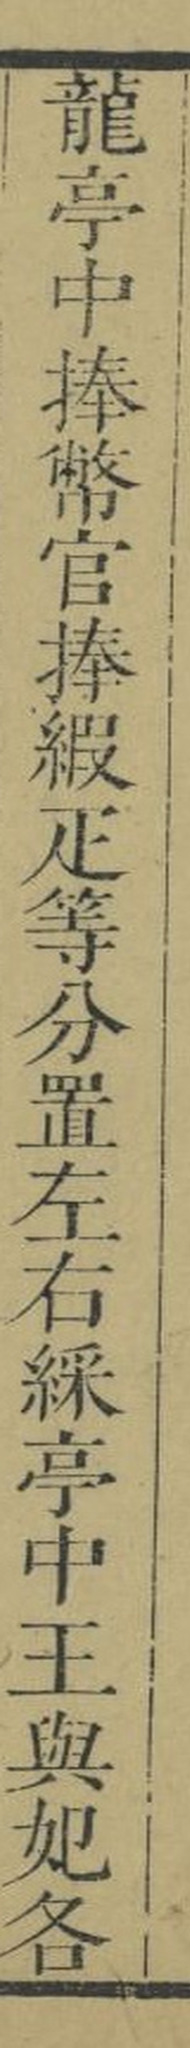龍亭中捧幣官捧縀疋等分置左右綵亭中王與妃各
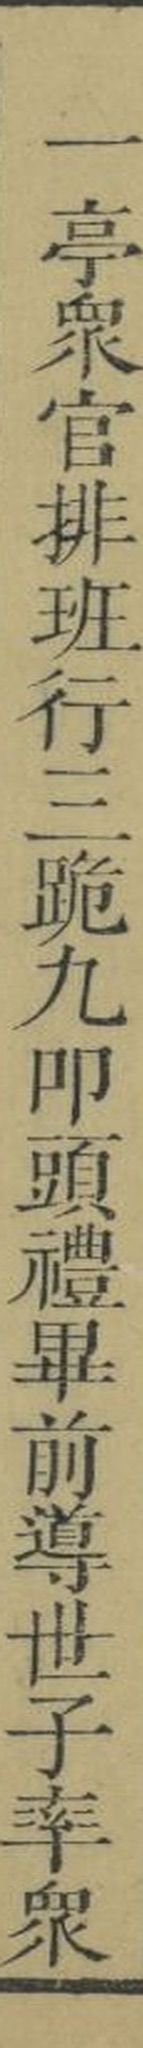一亭衆官排班行三跪九叩頭禮畢前導世子率衆
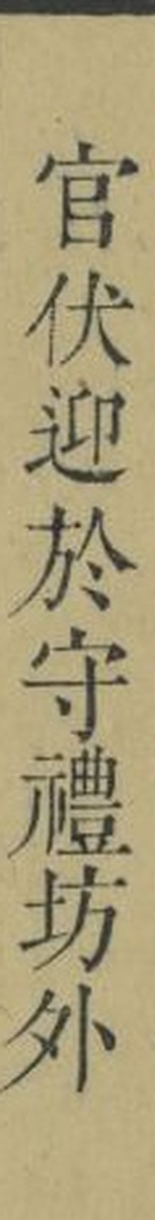官伏迎於守禮坊外
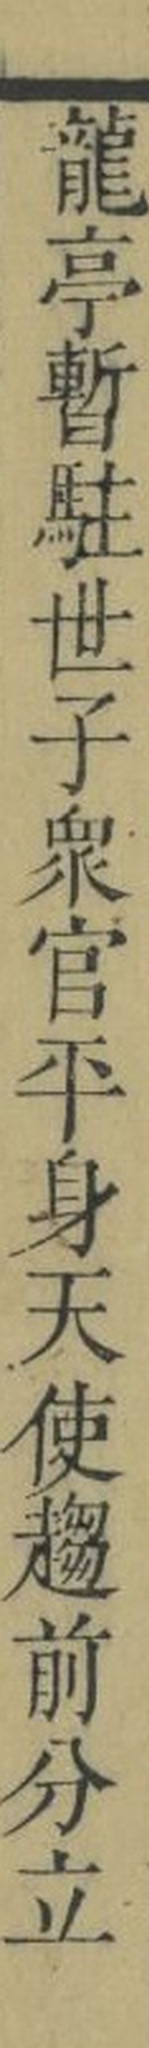龍亭暫駐世子衆官平身天使趨前分立
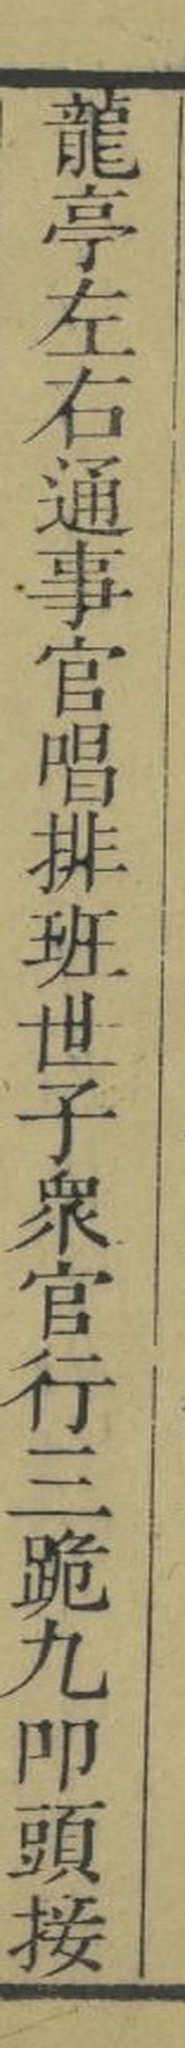龍亭左右通事官唱排班世子衆官行三跪九叩頭接
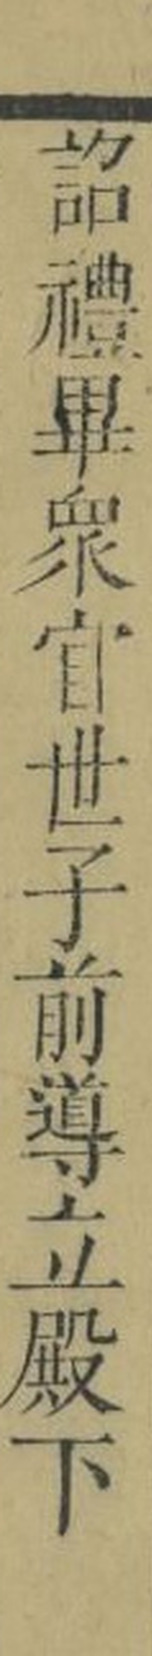詔禮畢衆官世子前導立殿下
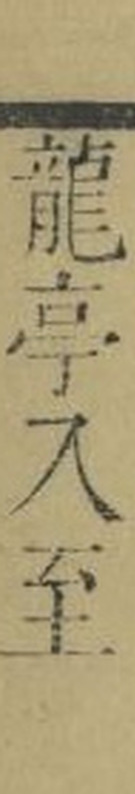龍亭入至

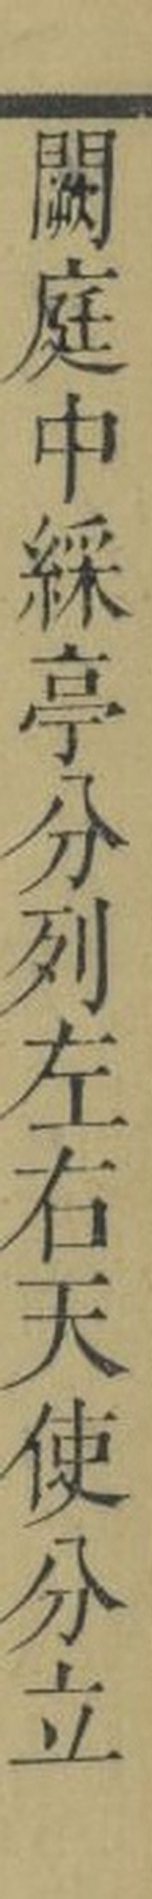闕庭中綵亭分列左右天使分立
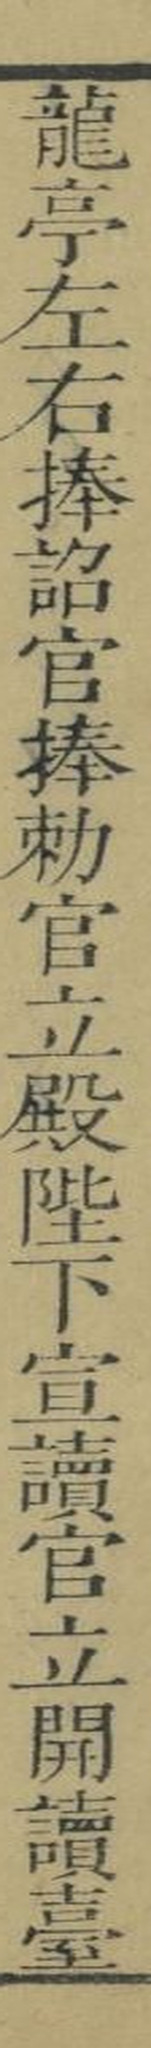龍亭左右捧詔官捧勅官立殿陛下宣讀官立開讀臺
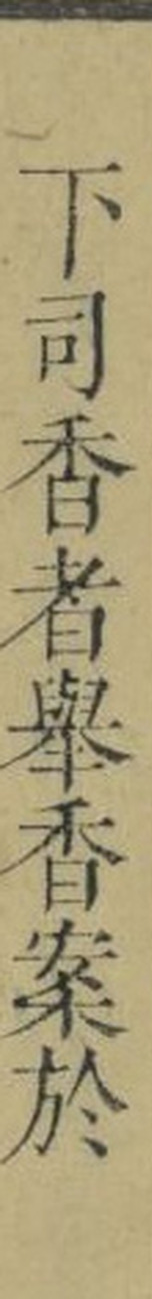下司香者舉香案於
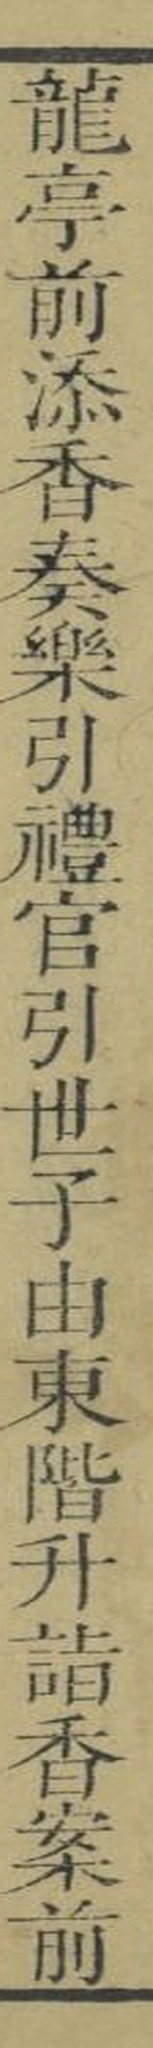龍亭前添香奏樂引禮官引世子由東階升詣香案前
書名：中山伝信録 巻二
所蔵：University of the Ryukyus Library
